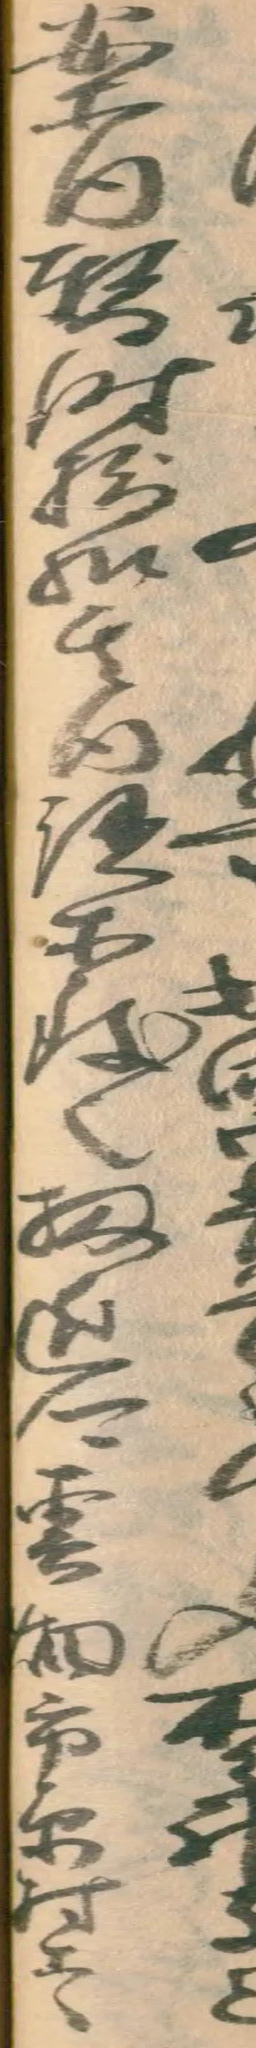案内暫時指扣其内認等致也扨近郷雲畑市原村等へ
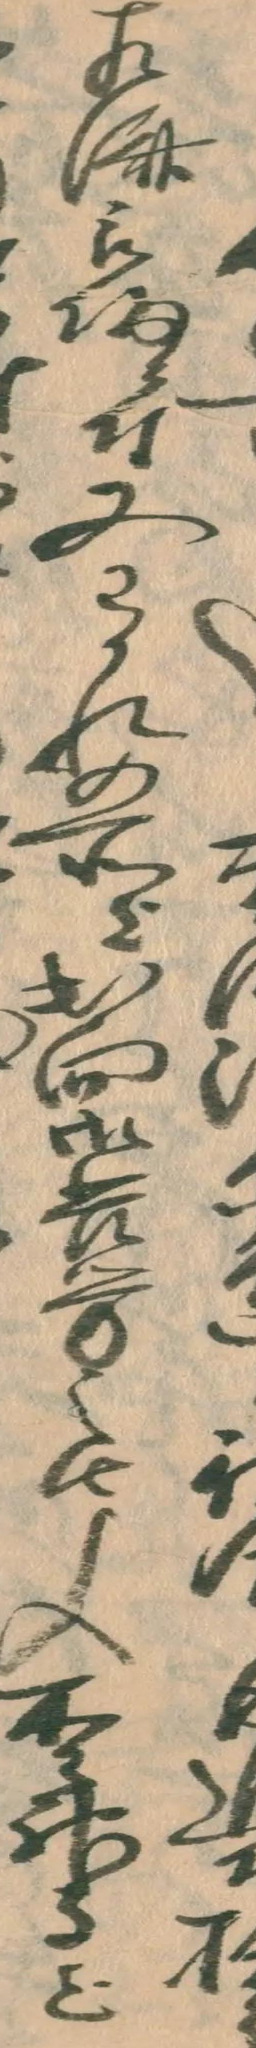相済被帰ニ付又わかれの所迄出向御苦労之由申入聖神寺迄
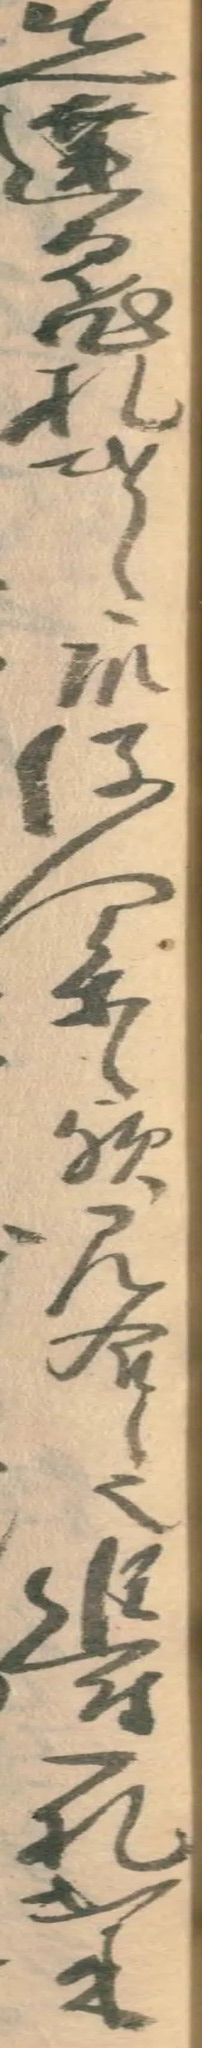先達而飛札出し候故役人参候歟見合し也追付一札出来
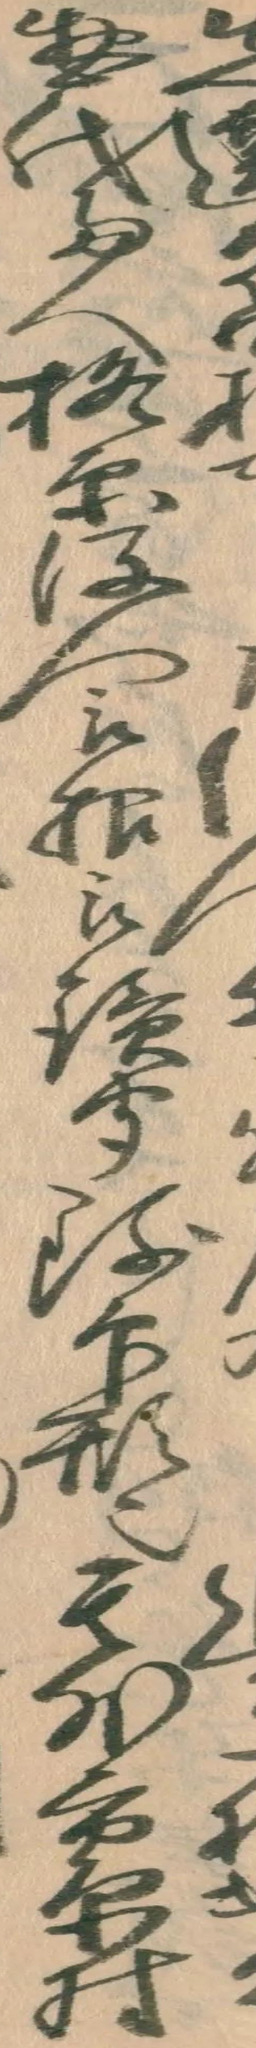惣代両人柊原役人被招被読聞致印形也其外市原村
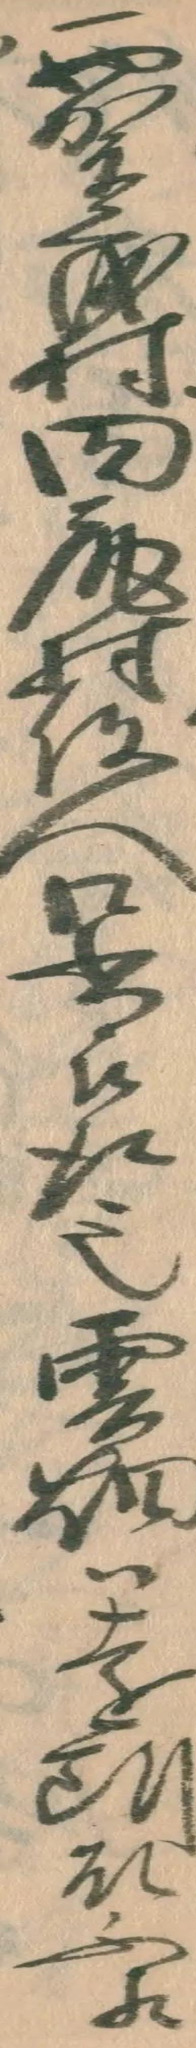西賀茂村田尻村役人口書被取候也雲畑ハ遠所故不相
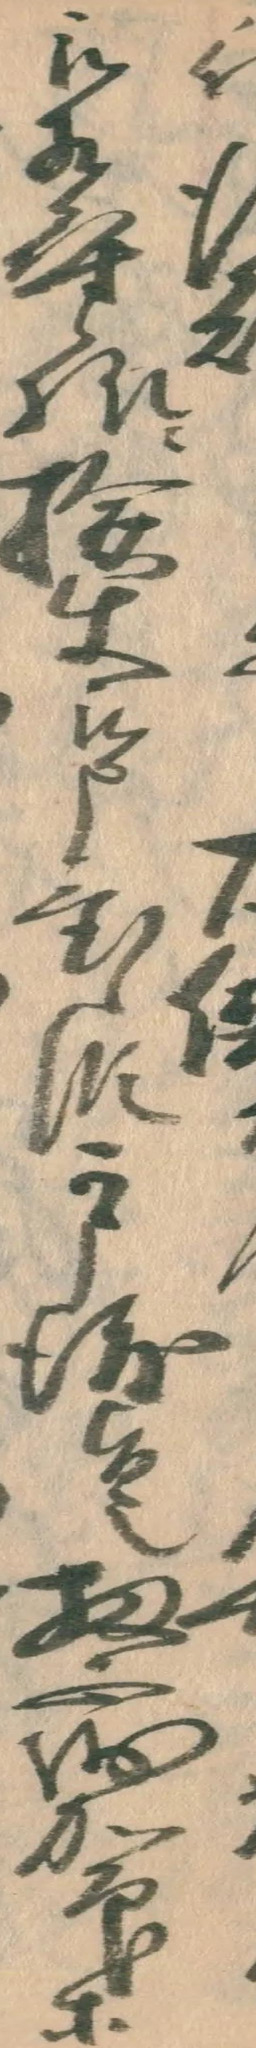被相尋候様ニ検使被申置候段可申渡旨也扨不洩加印等
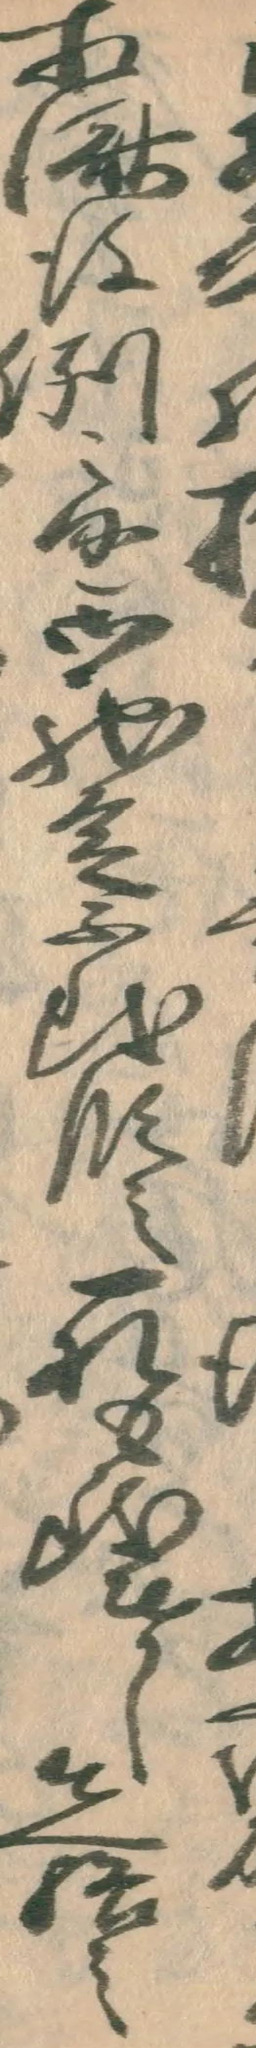相済後例之通御馳走不致段之一札も致出し先格之
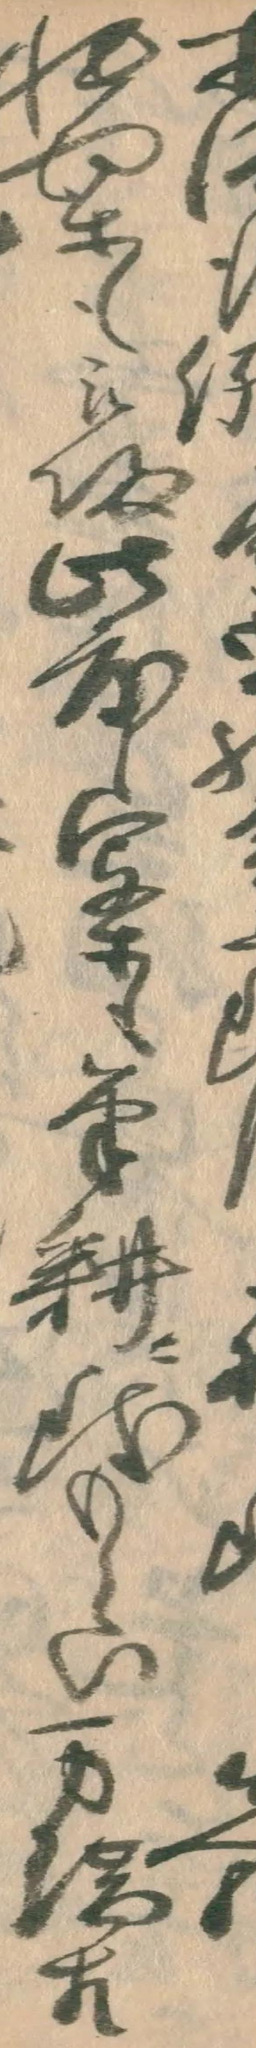等も被帰此度之写等も筆耕ニ致もらい万端相
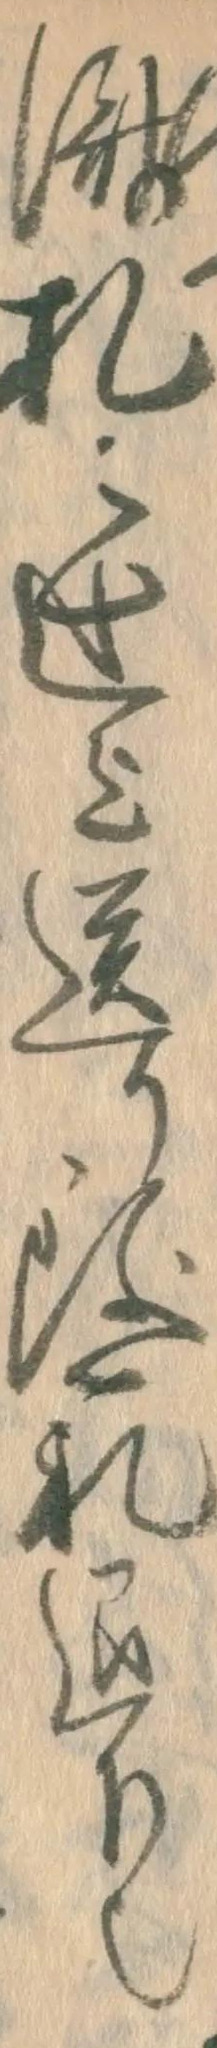済札之辻迄送り致一礼退下也
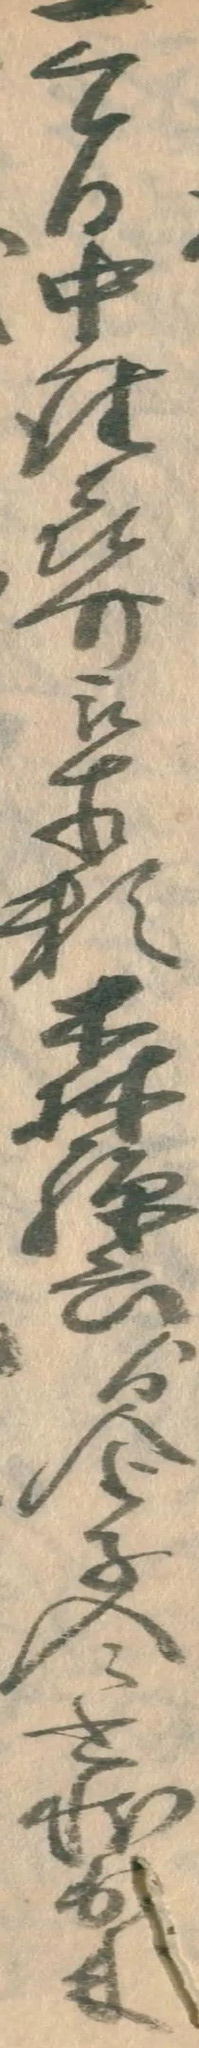一今日中座喜介被相頼森孫六ゟ金子合書状出来
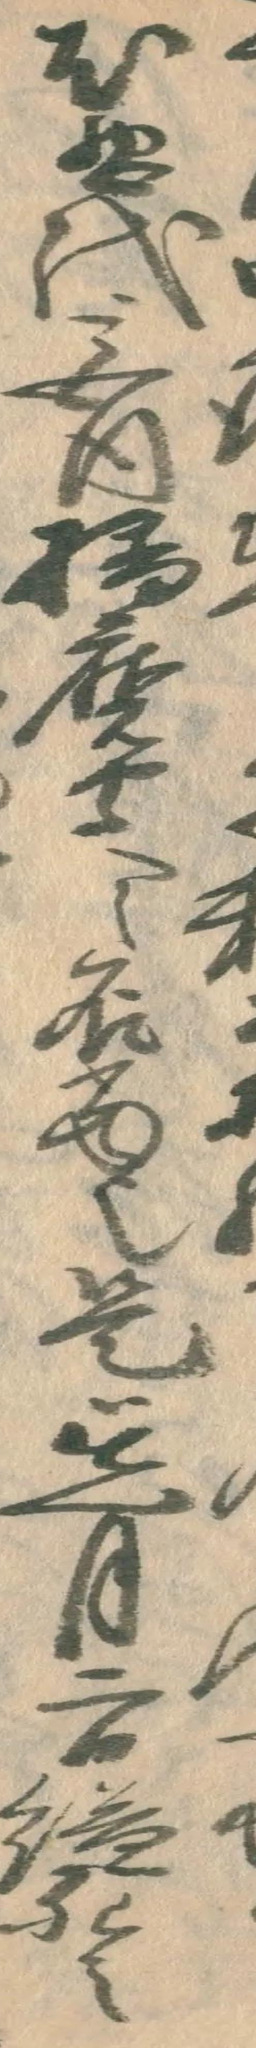尤惣代宮内播磨守へ之名当也是ハ先月二日縊死之
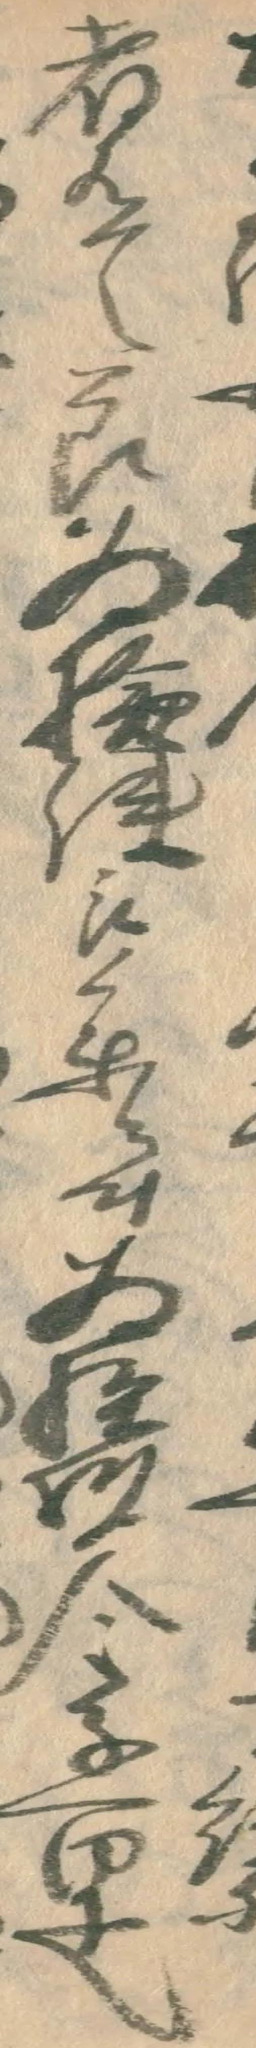者有之節為検使被参ニ付為金子百疋
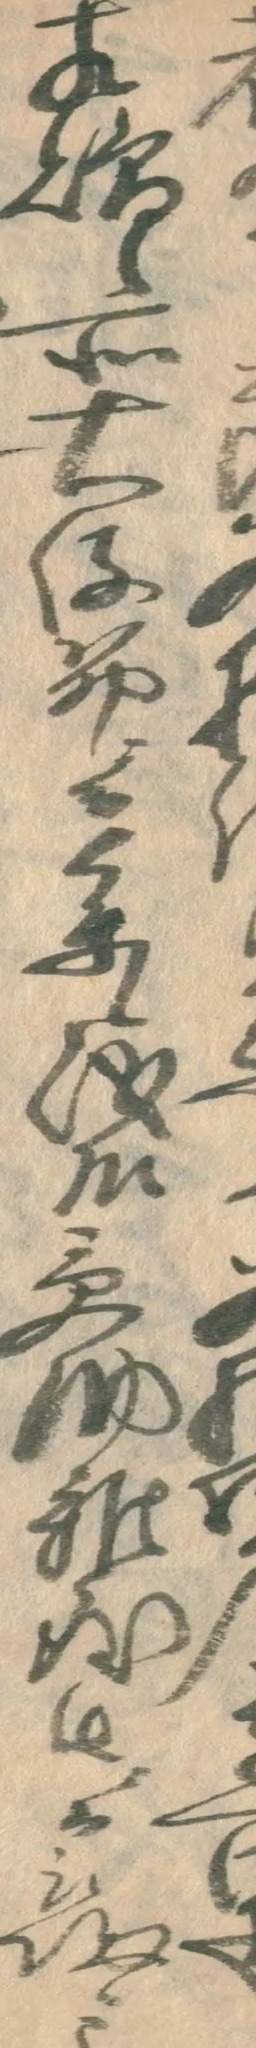相贈候所右役筋ニ而参候儀故受納難致由ニ而被帰候也

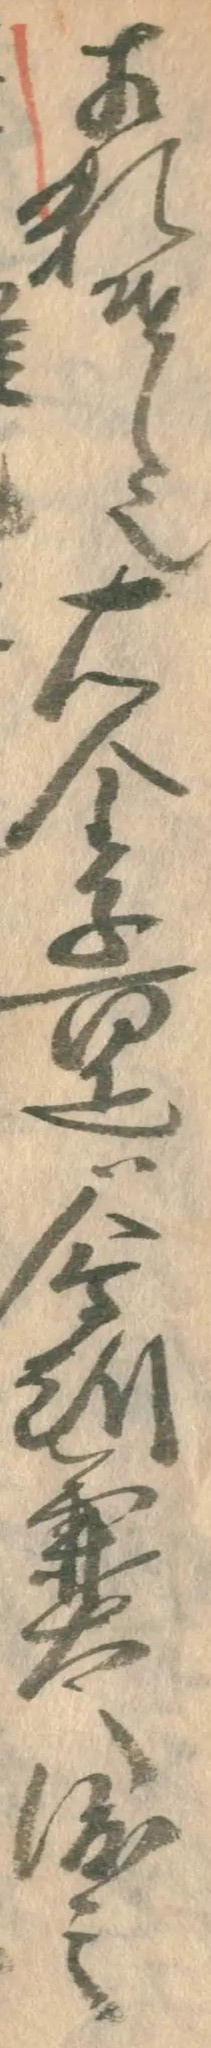相頼遣し也右金子百疋ハ会所兼太へ渡之
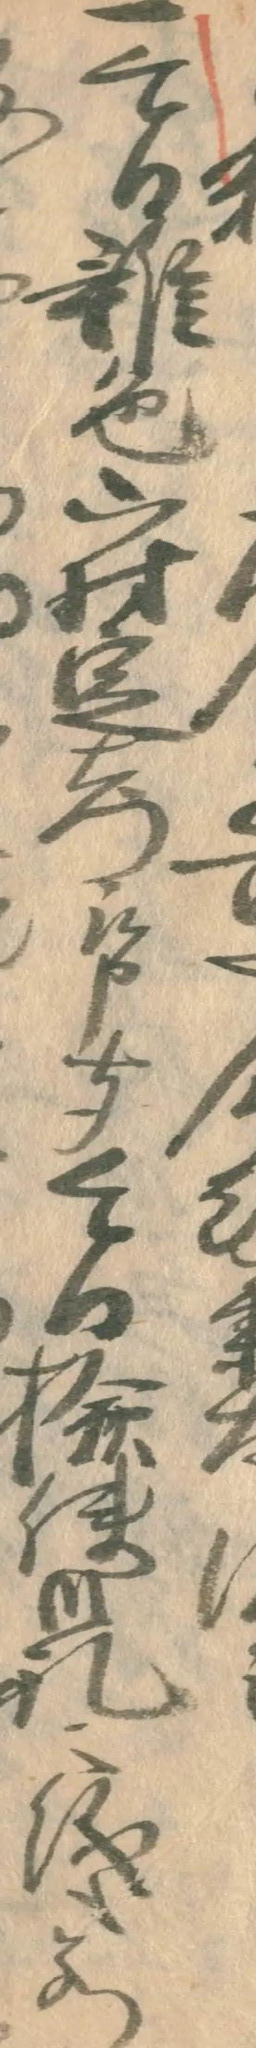一今日雑色山村定右衛門被申聞今日検使御礼之儀も若
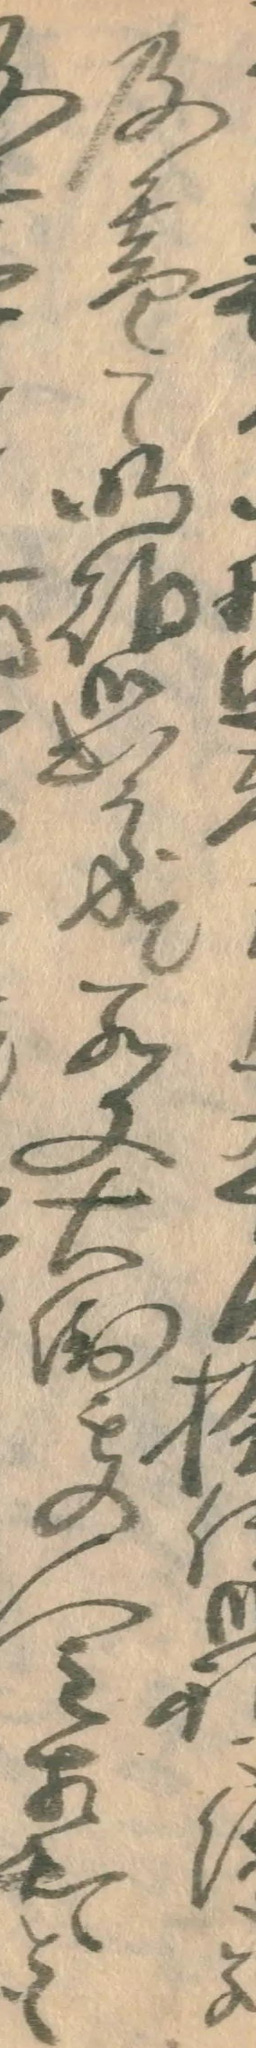及暮候て明朝御出被成候若又右倒もの人主相知候とも
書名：賀茂社記録. 第60冊
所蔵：国立国会図書館 National Diet Library, JAPAN
